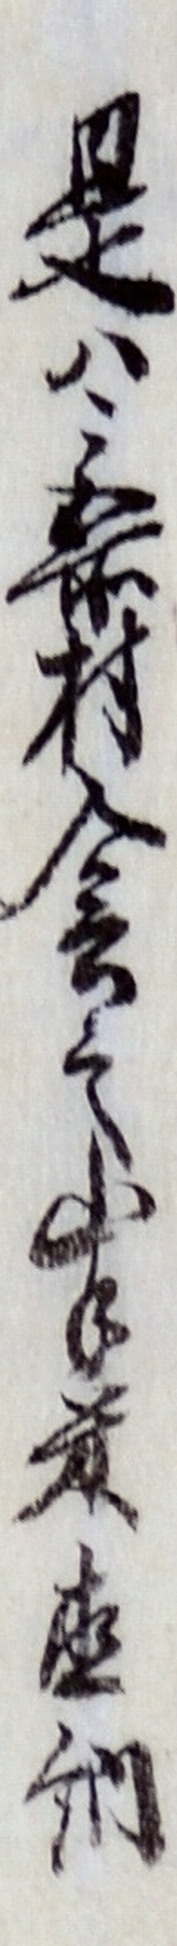是ハ宮所村入会之山手米直納

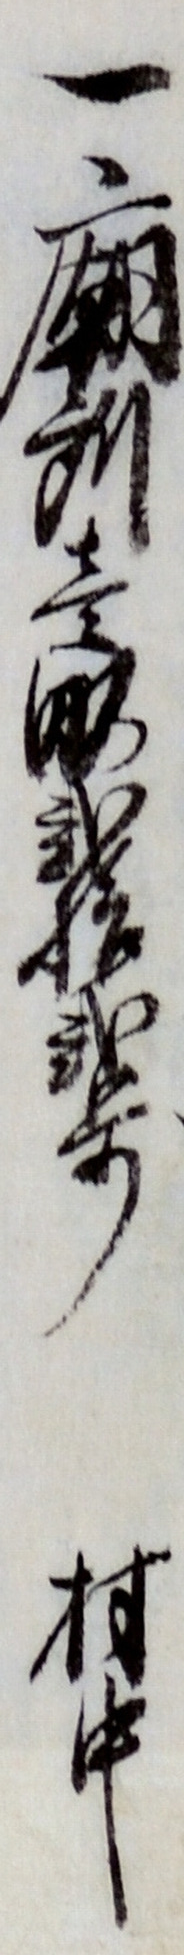一廟所壱畝弐拾弐歩村中
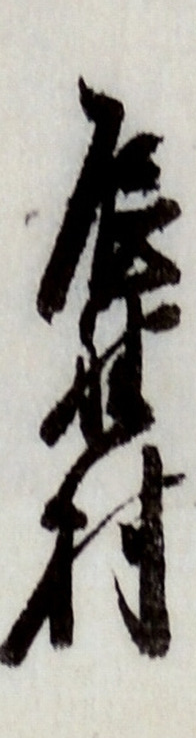辰野村
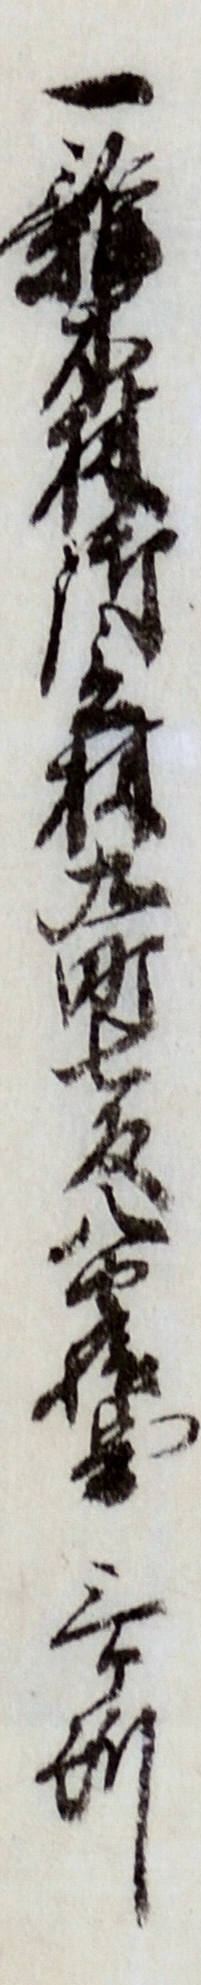一雑木林御立林九町七反八セ拾歩三ヶ所
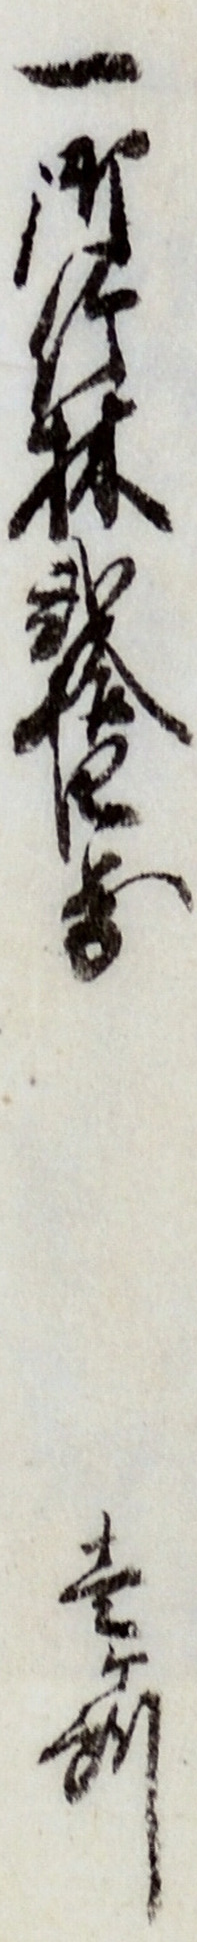一御竹林弐拾四歩壱ヶ所
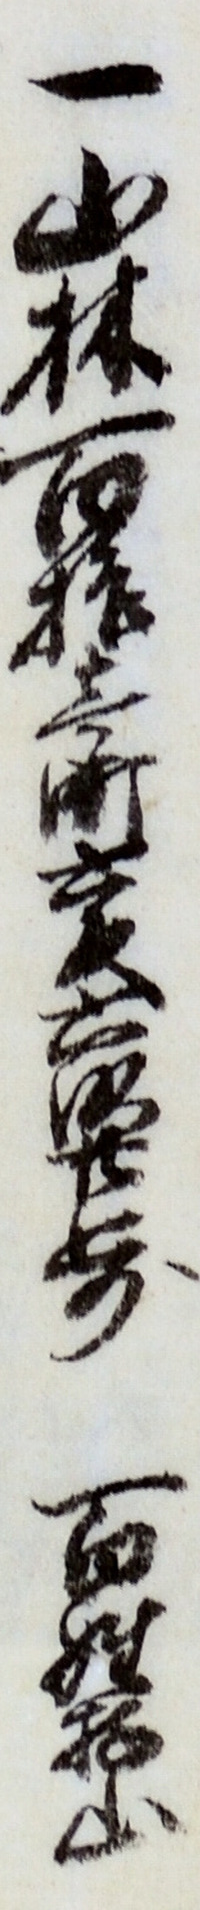一山林百拾壱町六反六畝廿歩百姓持山
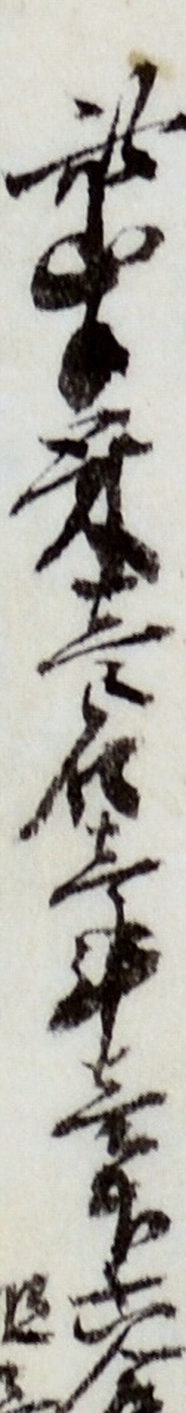此山手米壱石壱斗壱升六合七勺
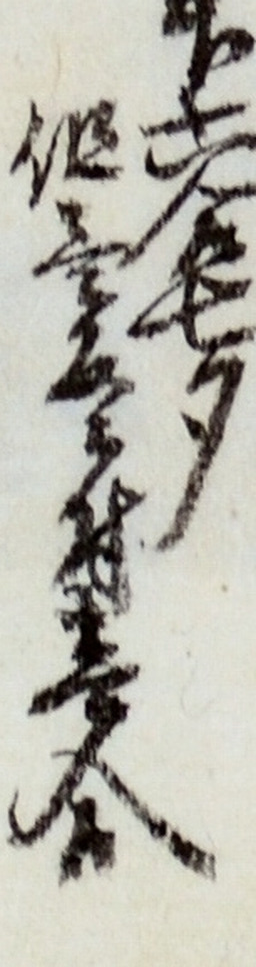但壱反ニ付壱合
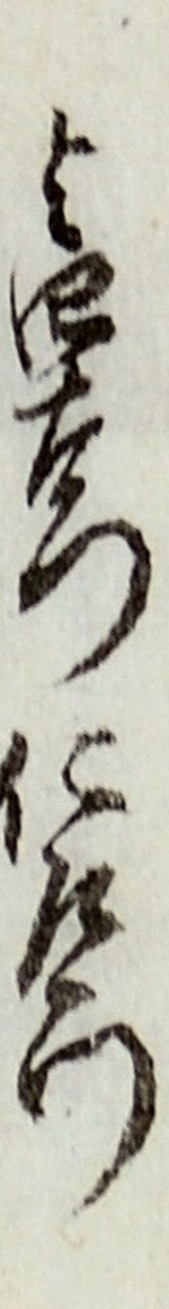与四右衛門仁左衛門

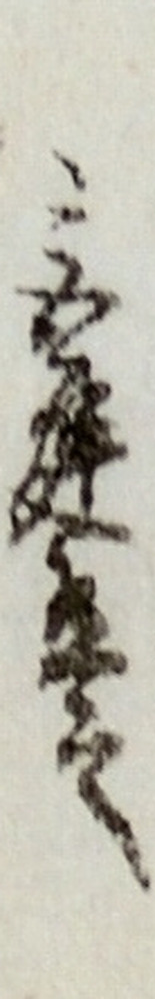宮建有之
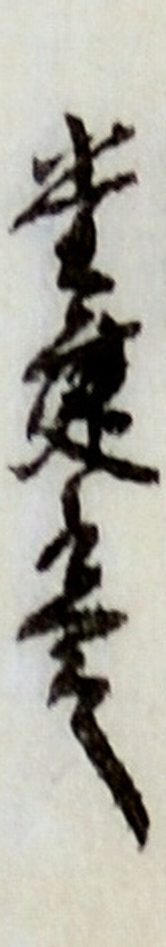堂建有之
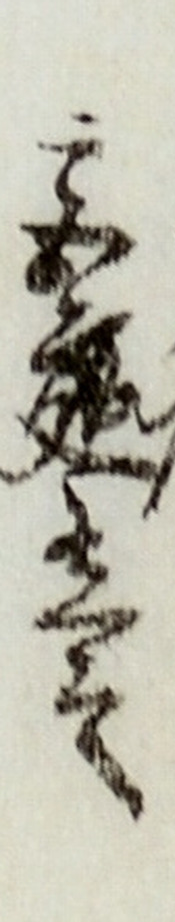宮建有之
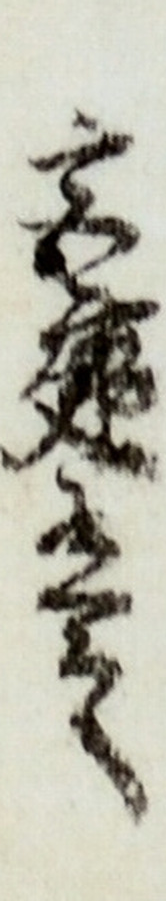宮建有之
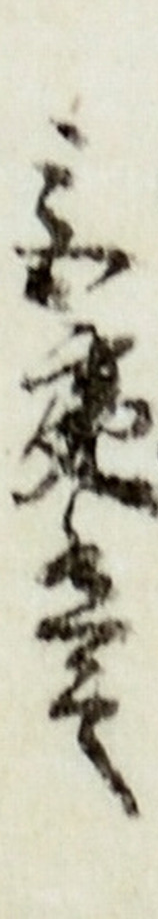宮建有之
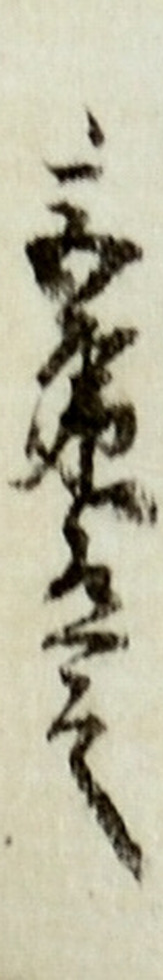宮建有之
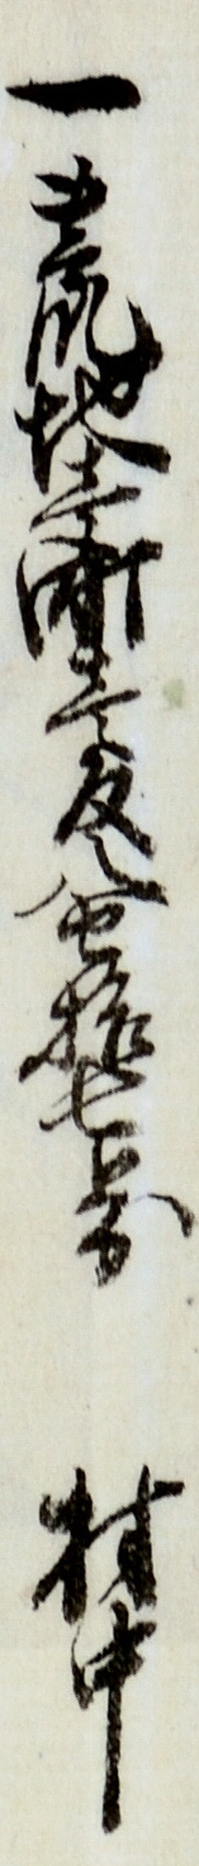一荒地壱町壱反八セ拾七歩村中
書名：御領分中山林社地手控
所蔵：伊那市立高遠町図書館・合同会社AMANE
